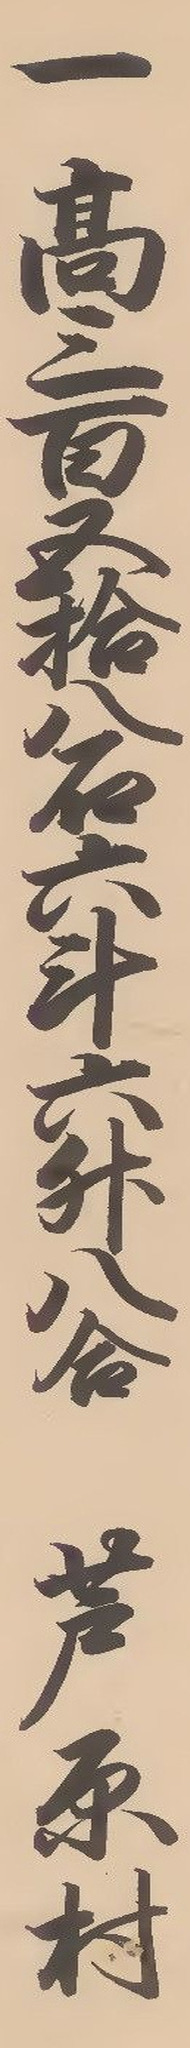一高三百五拾八石六斗六升八合芦原村

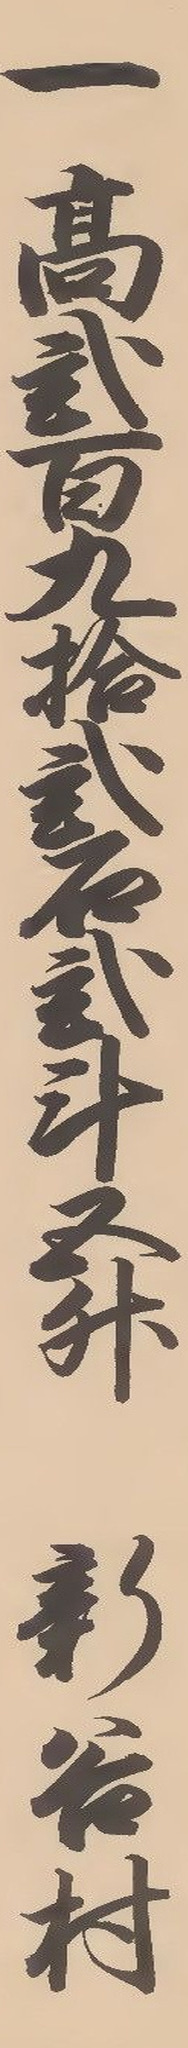一高弐百九拾弐石弐斗五升新谷村
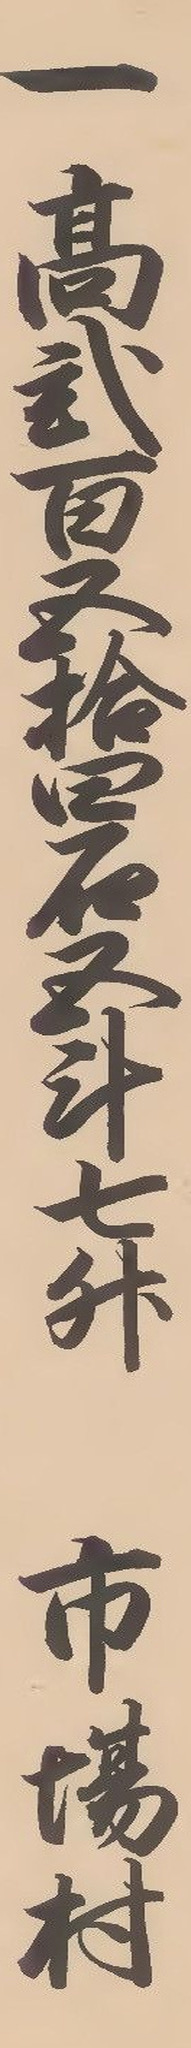一高弐百五拾四石五斗七升市場村
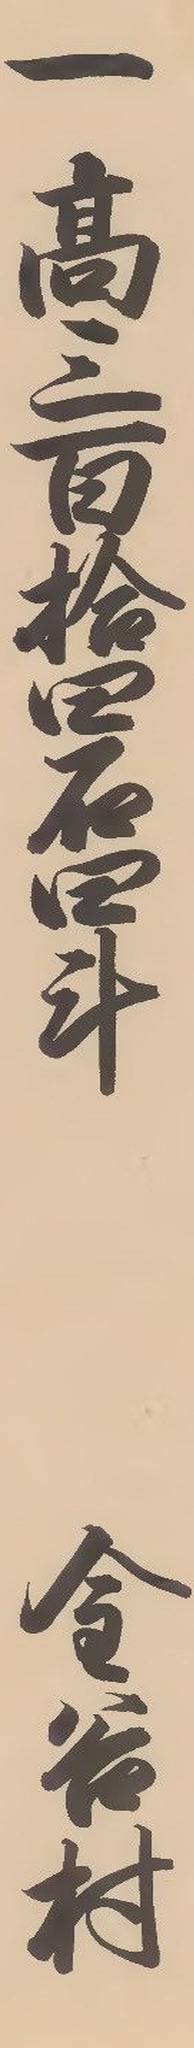一高三百拾四石四斗金谷村
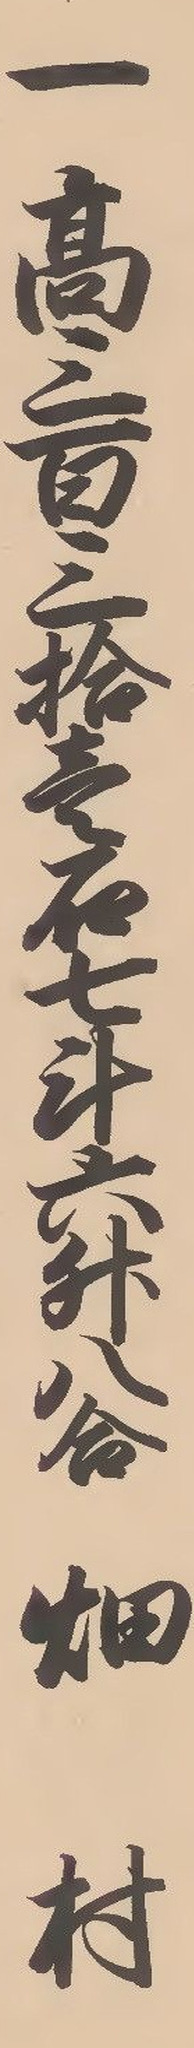一高三百三拾壱石七斗六升八合畑村
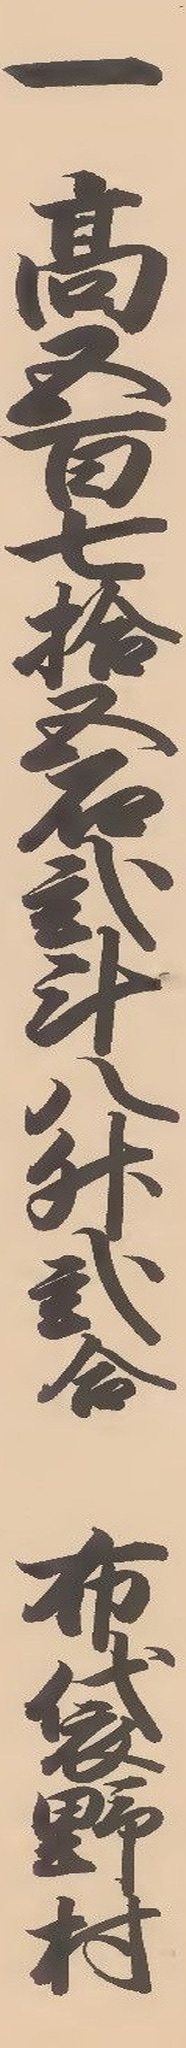一高五百七拾五石弐斗八升弐合布袋野村
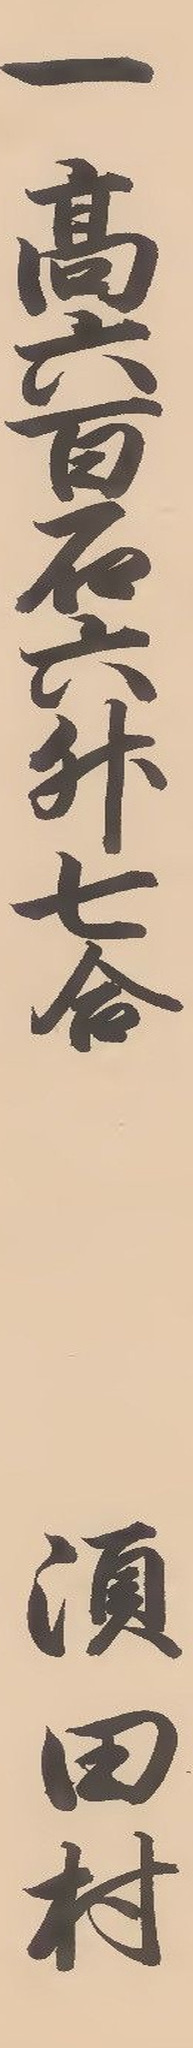一高六百石六升七合須田村
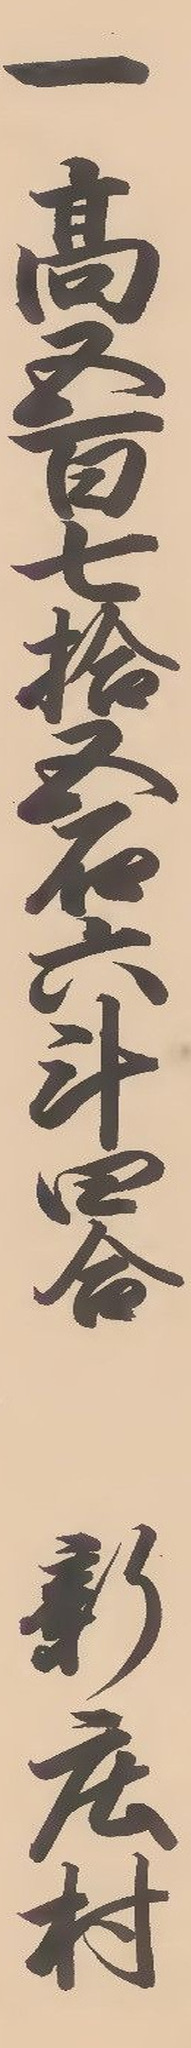一高五百七拾五石六斗四合新庄村

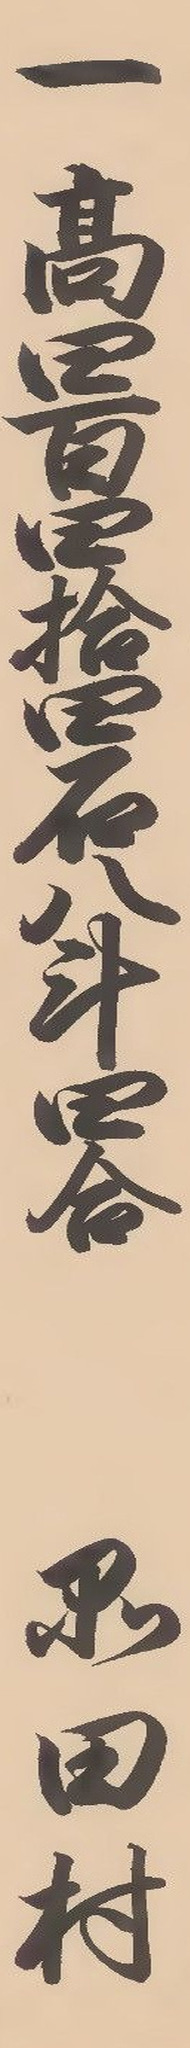一高四百四拾四石八斗四合品田村
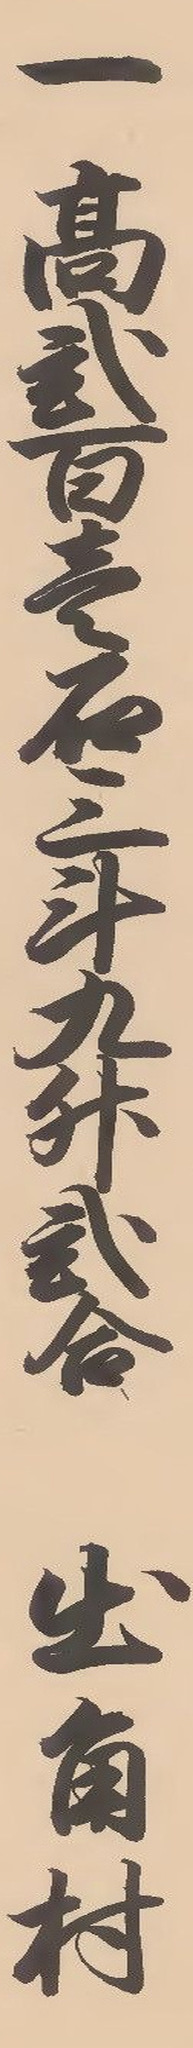一高弐百壱石三斗九升弐合出角村
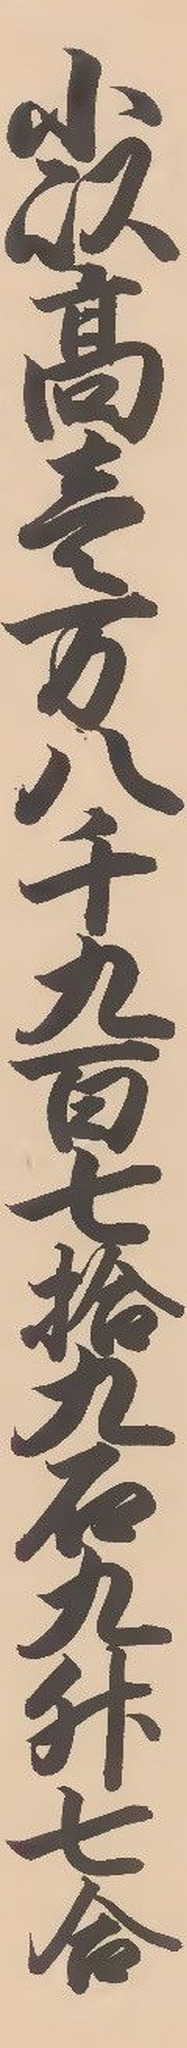小以高壱万八千九百七拾九石九升七合

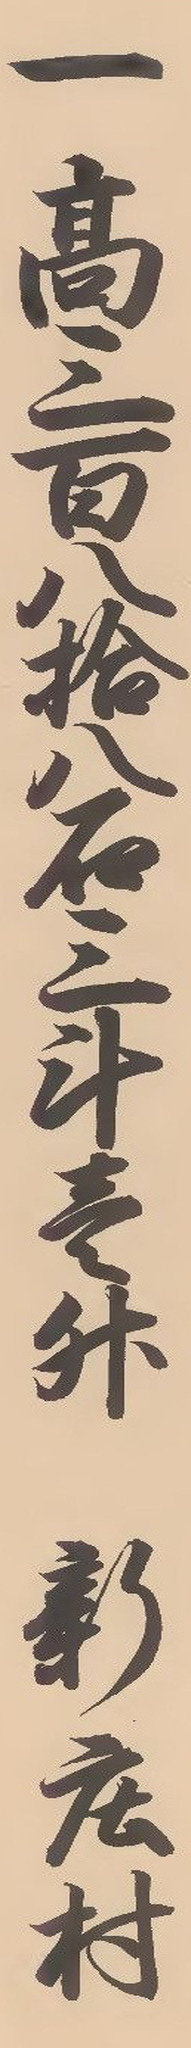一高三百八拾八石三斗壱升新庄村

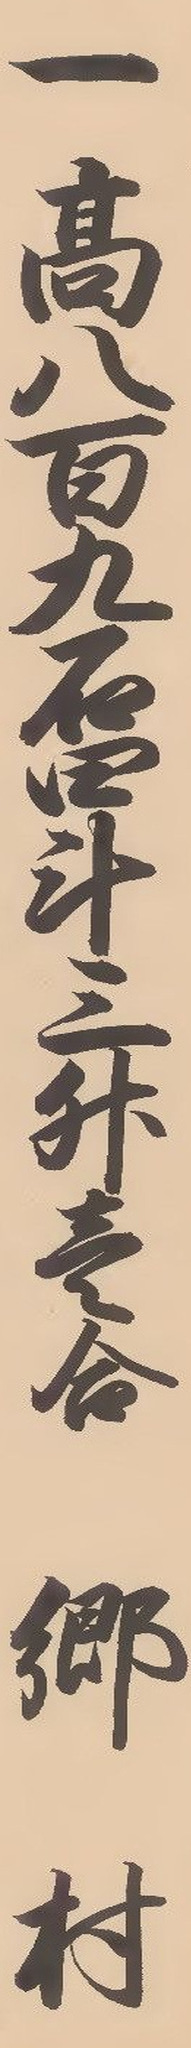一高八百九石四斗三升壱合郷村
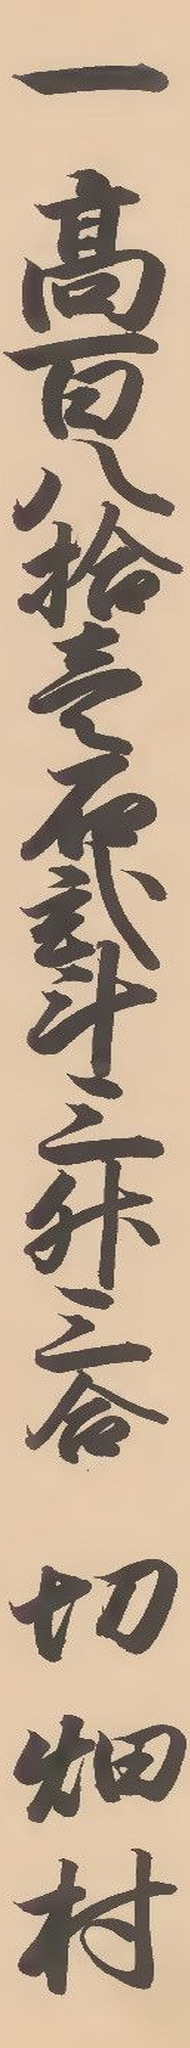一高百八拾壱石弐斗三升三合切畑村
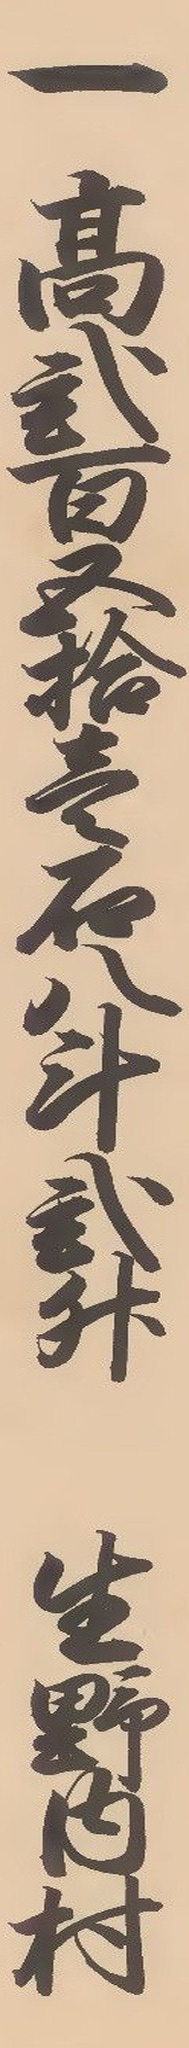一高弐百五拾壱石八斗弐升生野内村
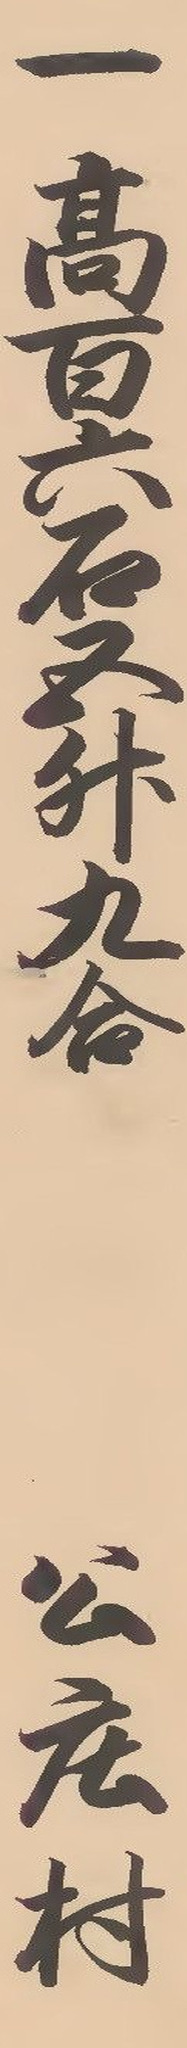一高百六石五升九合公庄村
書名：丹後国郷帳
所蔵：国立公文書館 National Archives of Japan
